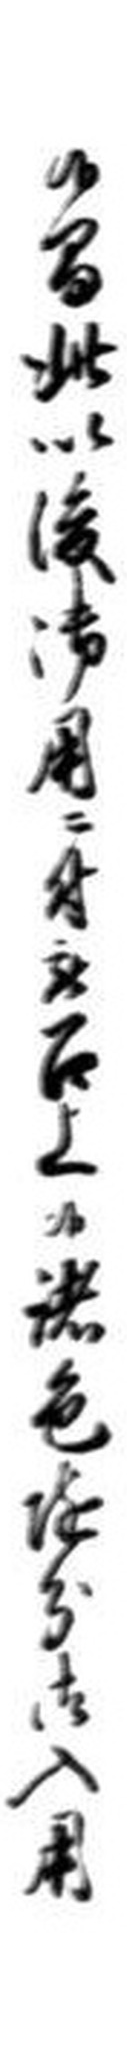候間此以後御用ニ付被召上候諸色随分御入用
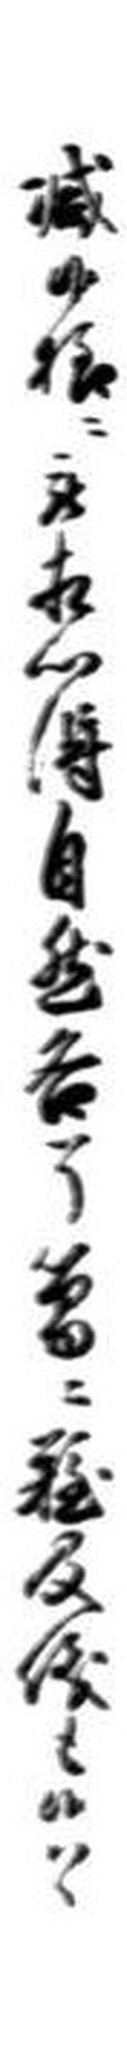減候様ニ被相心得自然各了簡ニ難及儀も候ハヽ
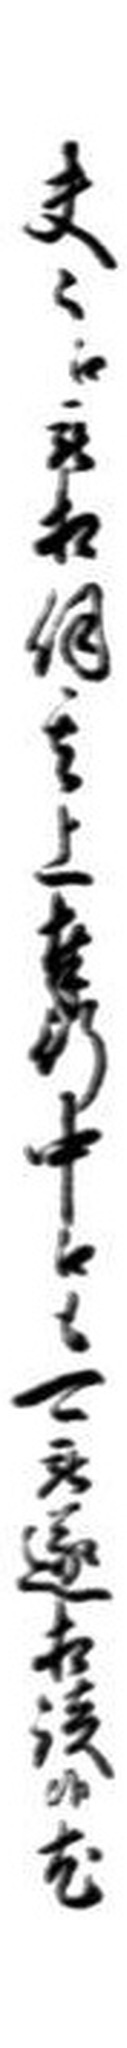夫々江被相伺其上奉行中江も可被遂相談候尤
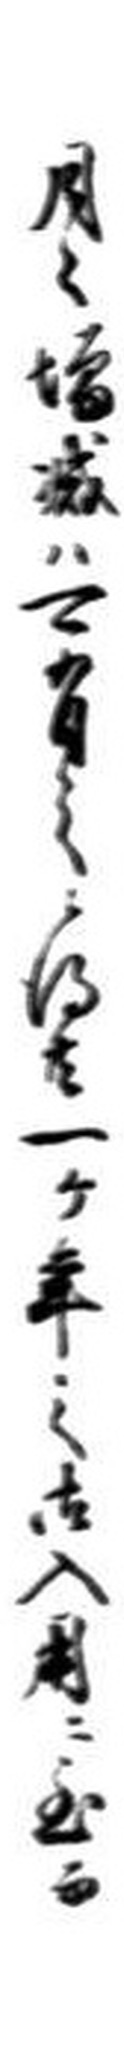月々増減ハ可有之候得共一ヶ年之御入用ニ至而
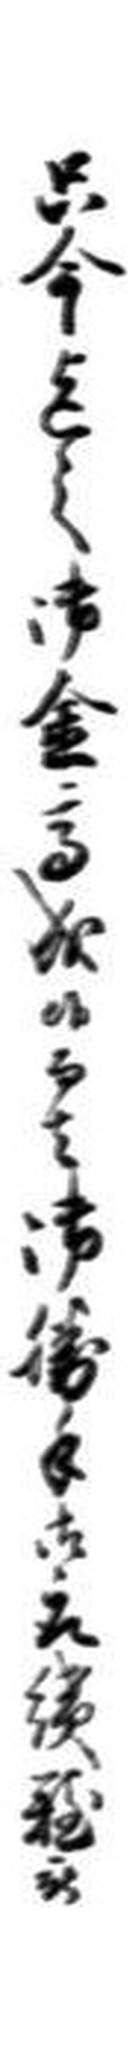只今迄之御金高成候而者御勝手御取続難被
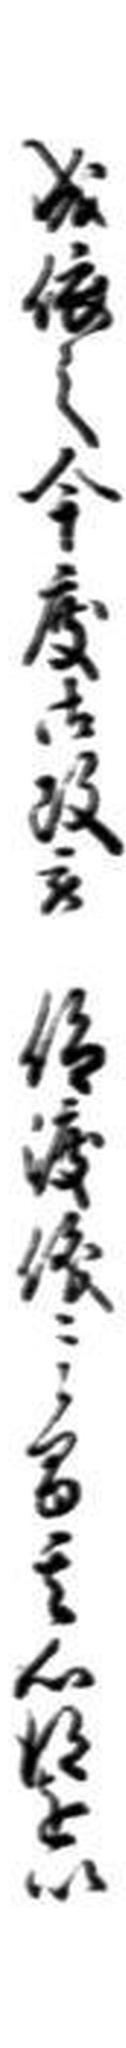成依之今度御改被仰渡儀ニ候間其心得を以
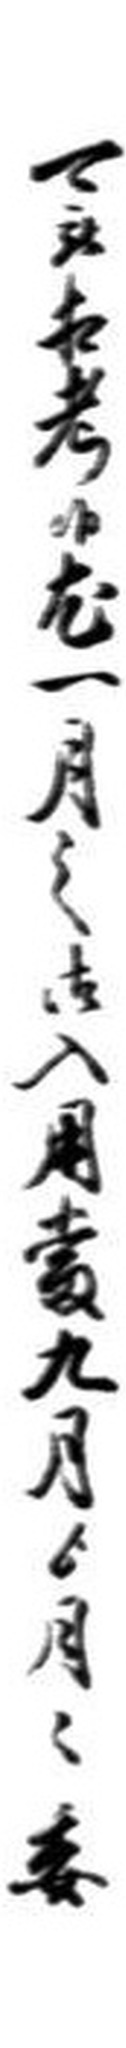可被相考候尤一月之御入用当九月ゟ月々委
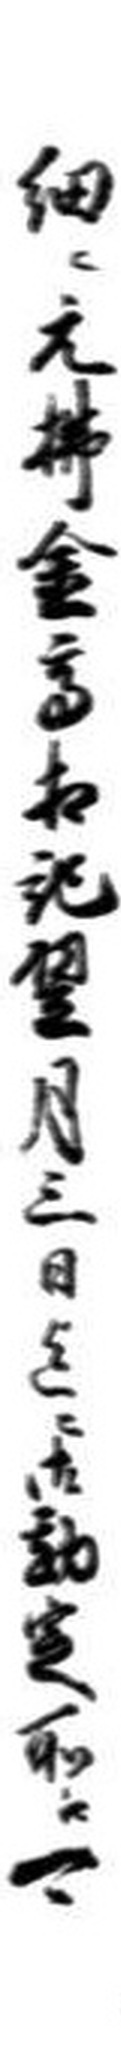細ニ元払金高相記翌月三日迄ニ御勘定所江可
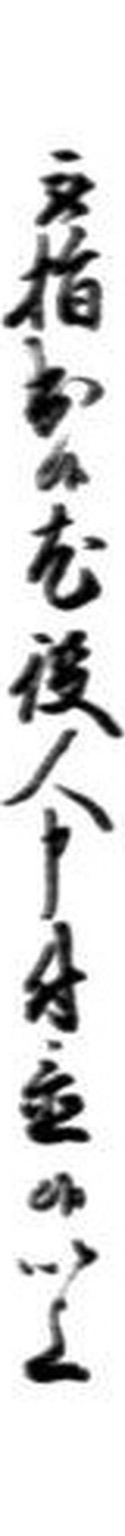指出候尤役人申付置候以上

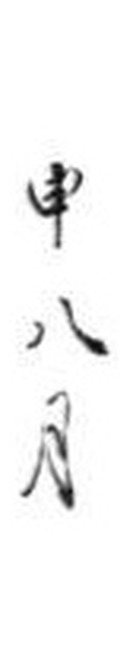申八月
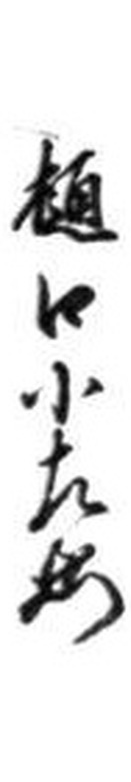樋口小左衛門
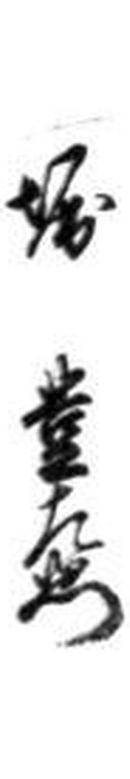堀豊左衛門
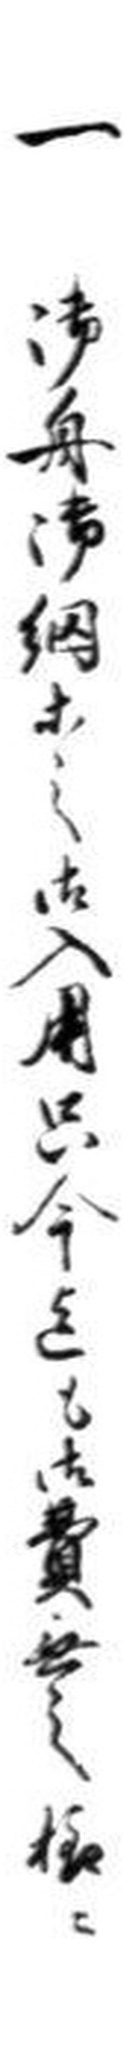一御舟御網等之御入用只今迄も御費無之様ニ
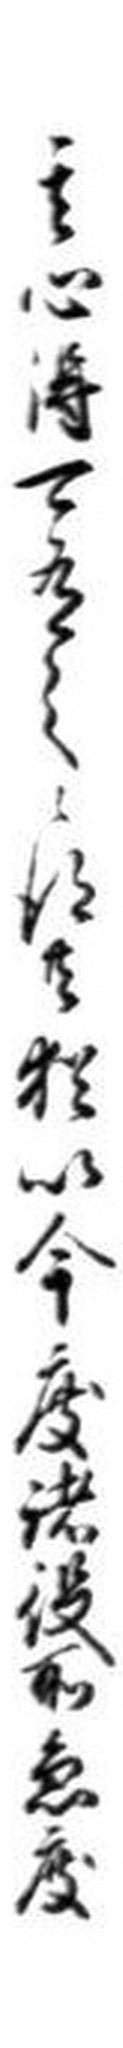其心得可有之候得共猶以今度諸役所急度
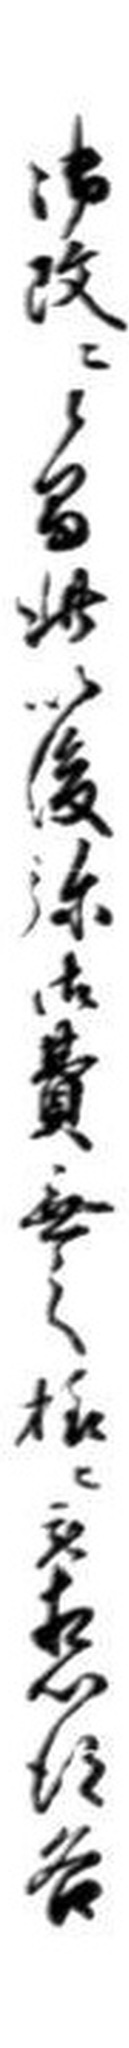御改ニ候間此以後弥御費無之様ニ被相心得各
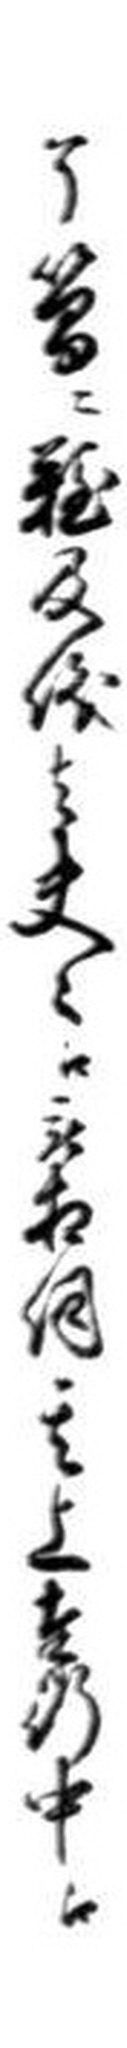了簡ニ難及儀者夫々江被相伺其上奉行中江
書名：家譜 三十一 吉邦公 享保元年
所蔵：福井県文書館 Fukui Prefectural Archives
